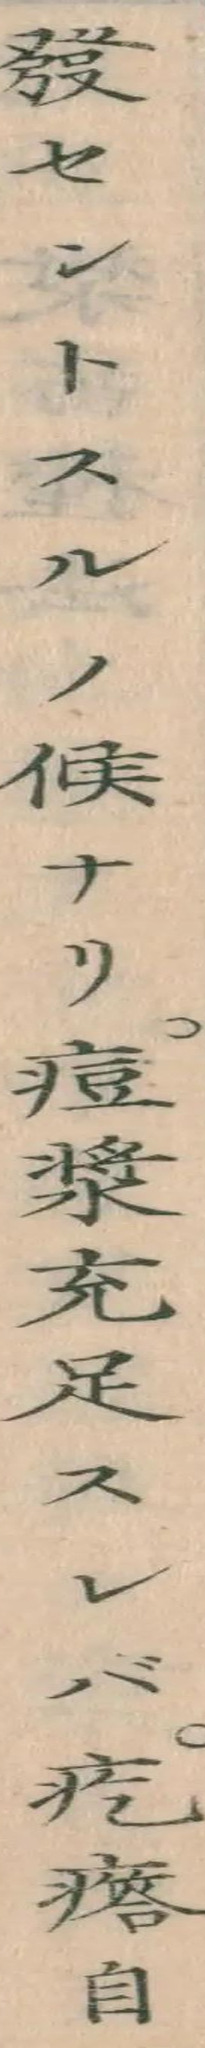発セントスルノ候ナリ。痘漿充足スレバ。疙瘩自
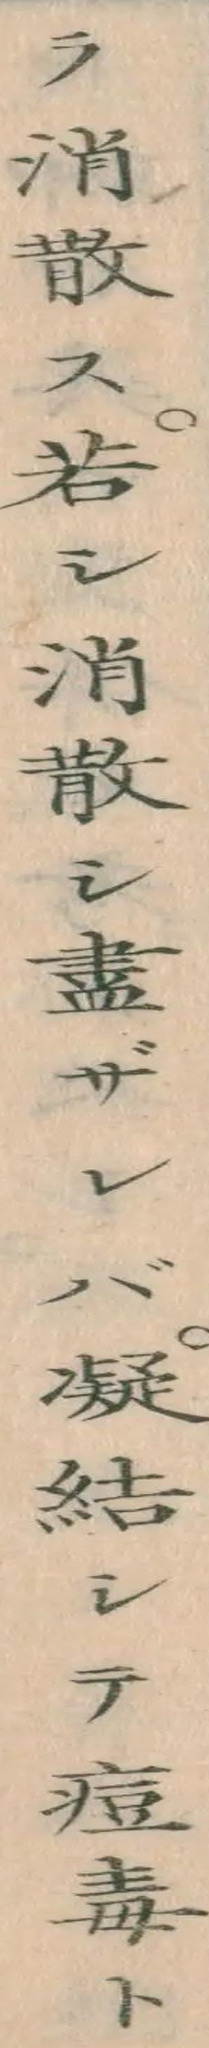ラ消散ス。若シ消散シ尽ザレバ。。凝結シテ痘毒ト
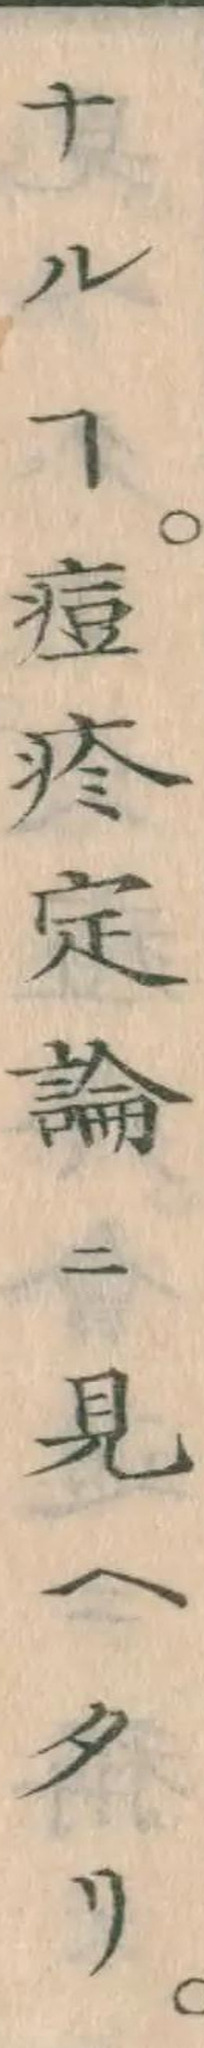ナルヿ。痘疹定論ニ見ヘタリ。
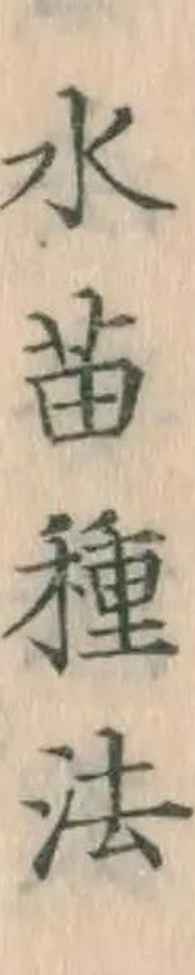水苗種法
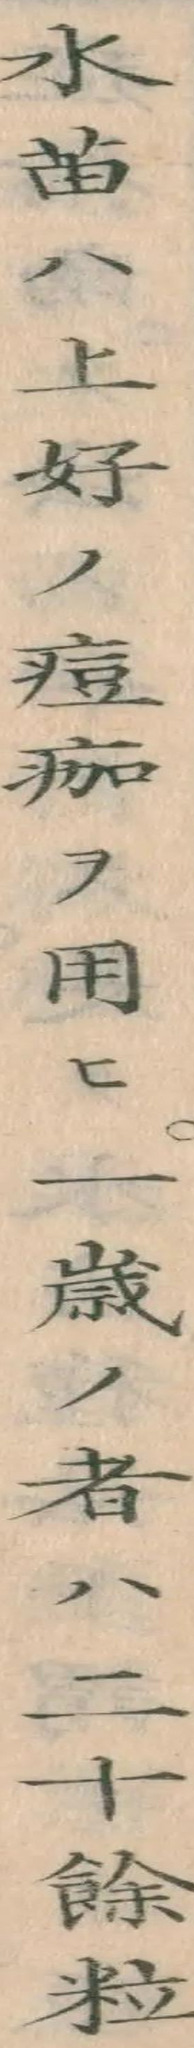水苗ハ上好ノ痘痂ヲ用ヒ。一歳ノ者ハ二十余粒。
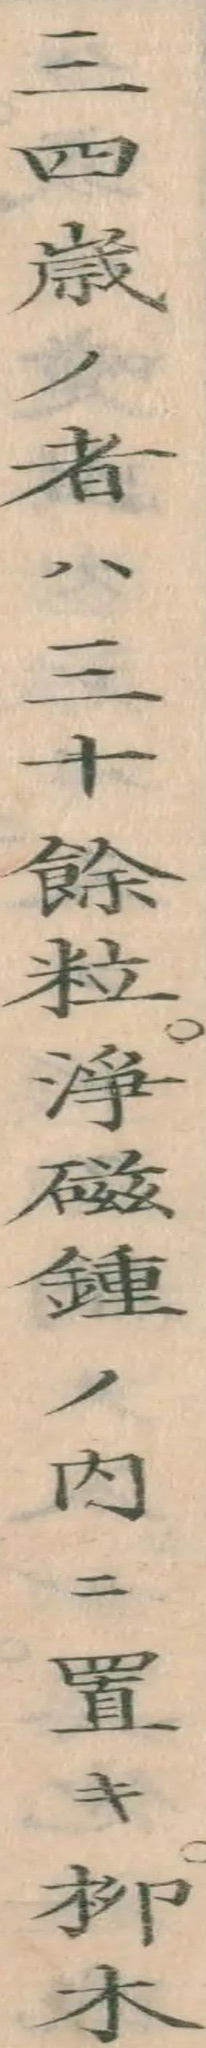三四歳ノ者ハ三十余粒。浄磁鐘ノ内ニ置キ。柳木
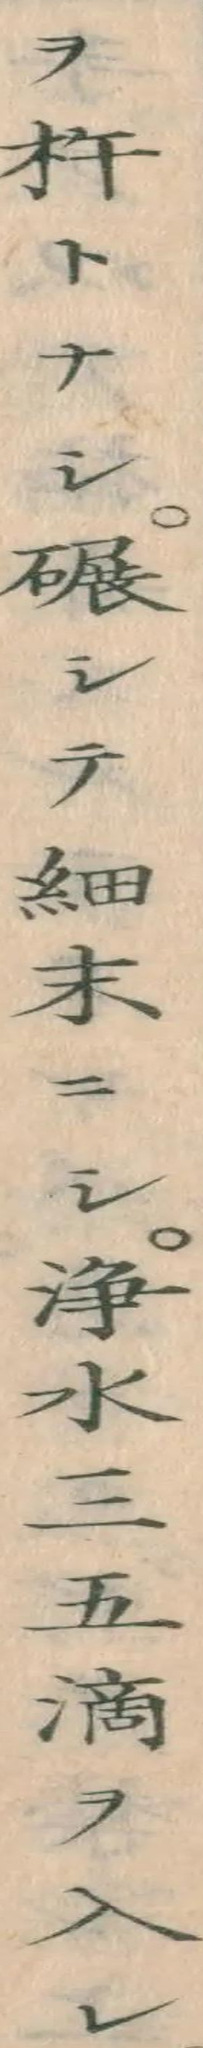ヲ杵トナシ。碾シテ細末ニシ。浄水三五滴ヲ入レ。
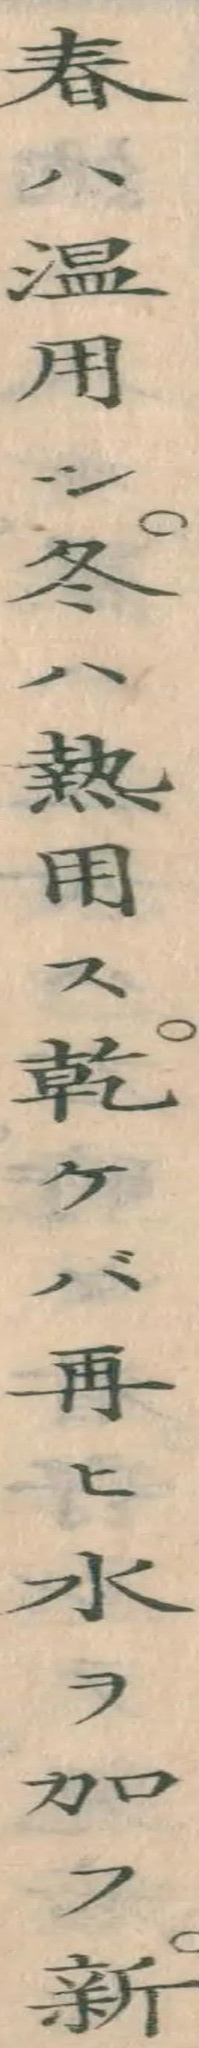春ハ温用シ。冬ハ熱用ス。乾ケバ再ヒ水ヲ加フ。新
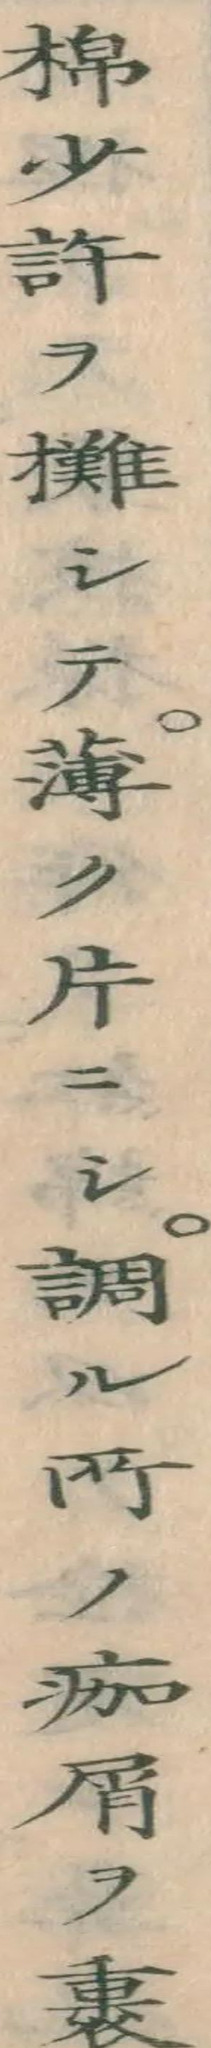棉少許ヲ攤シテ。薄ク片ニシ。調ル所ノ痂屑ヲ裹

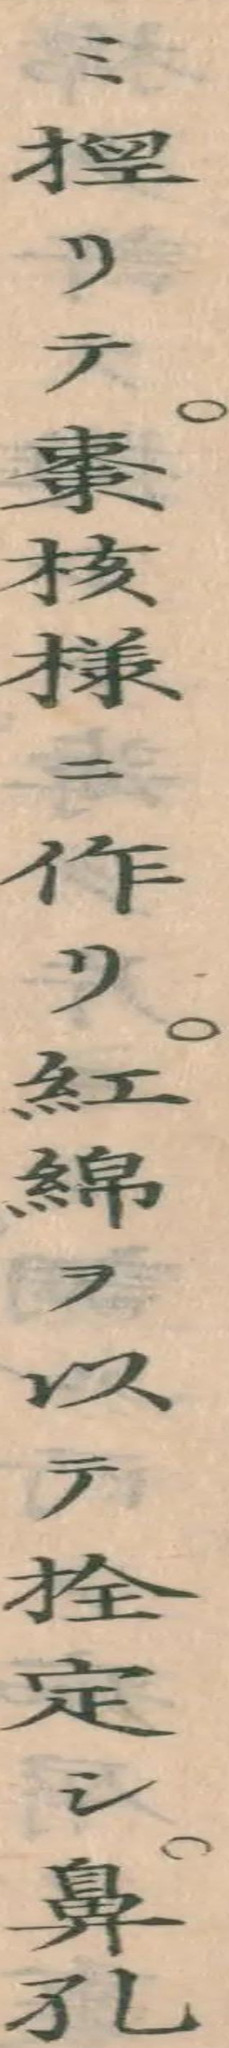ミ捏リテ。棗核様ニ作り。紅綿ヲ以テ拴定シ。鼻孔
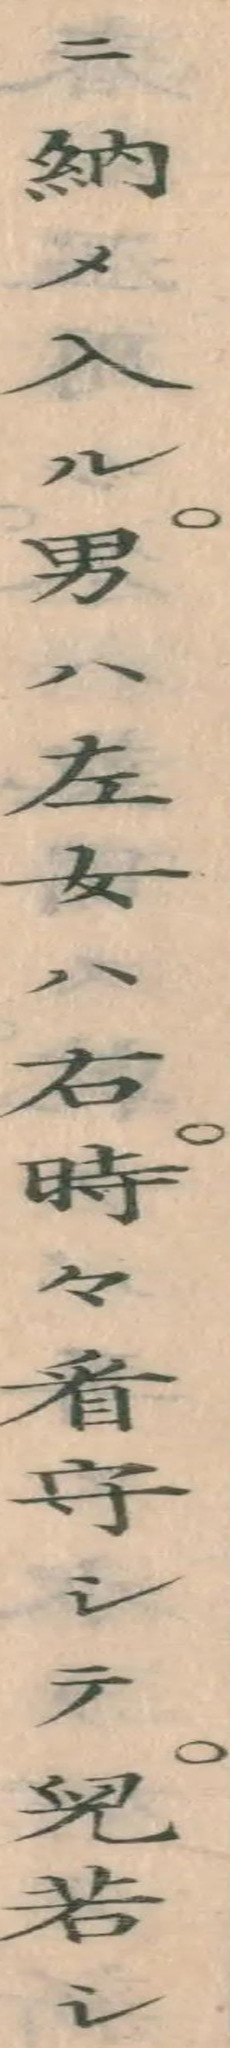ニ納メ入ル。男ハ左女ハ右。時々看守シテ。児若シ
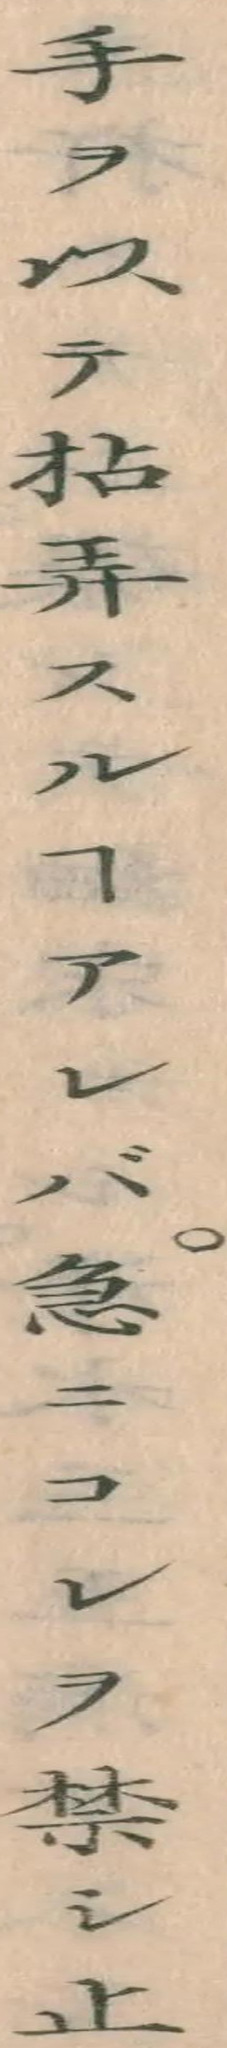手ヲ以テ拈弄スルヿアレバ。急ニコレヲ禁シ止
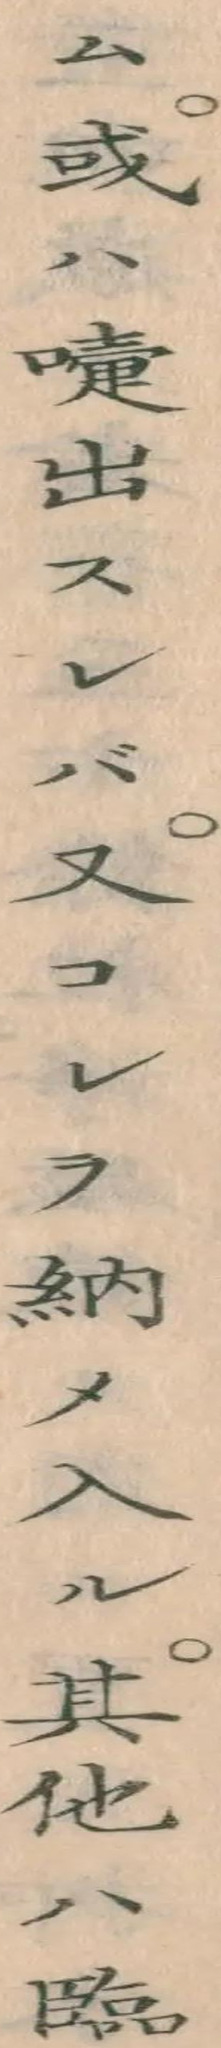ム。或ハ嚔出スレバ。又コレヲ納メ入ル。其他ハ臨
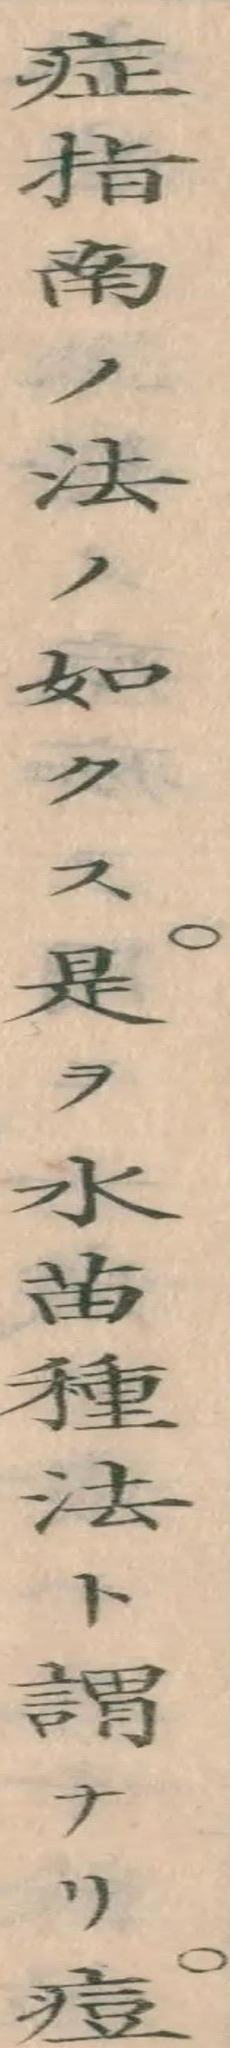症指南ノ法ノ如クス。是ヲ水苗種法ト謂ナリ。痘
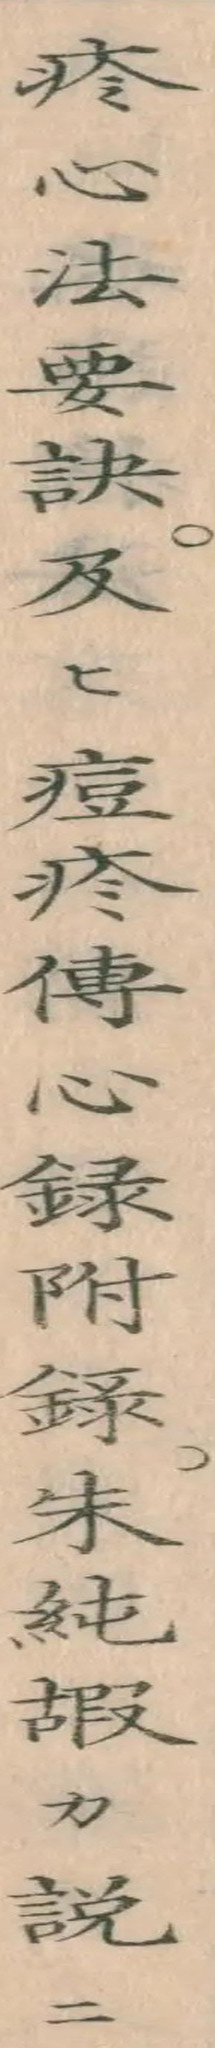疹心法要訣。及ヒ痘疹伝心録附錄。朱純嘏カ説ニ
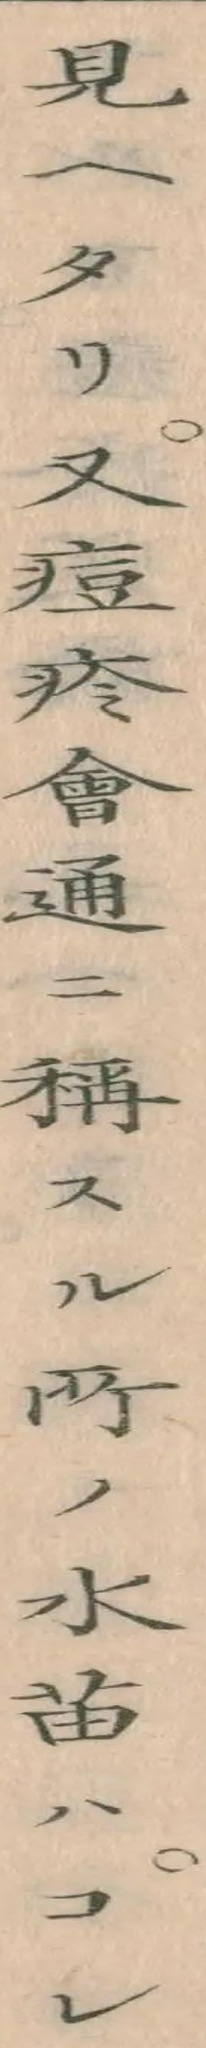見ヘタリ。又痘疹会通ニ称スル所ノ水苗ハ。コレ
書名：種痘弁義
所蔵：国立国会図書館 National Diet Library, JAPAN
